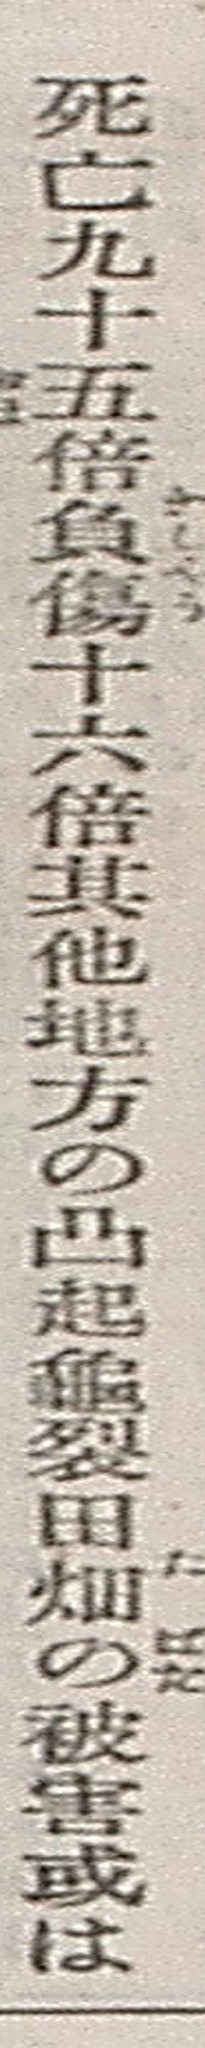死亡九十五倍負傷十六倍其他地方の凸起亀裂田畑の被害或は
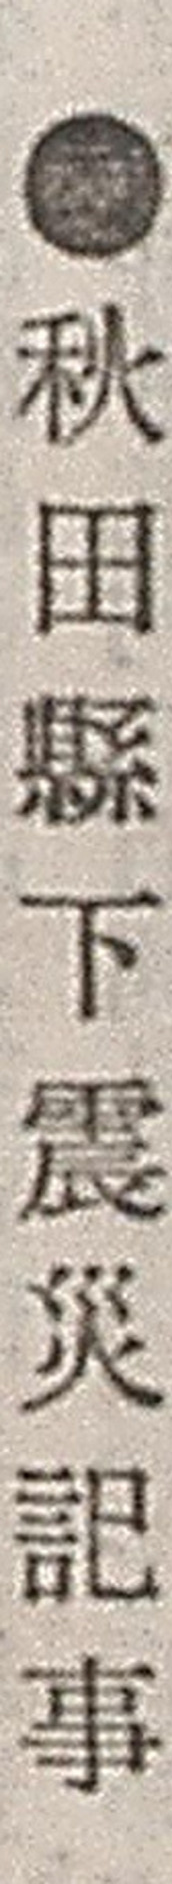●秋田県下震災記事
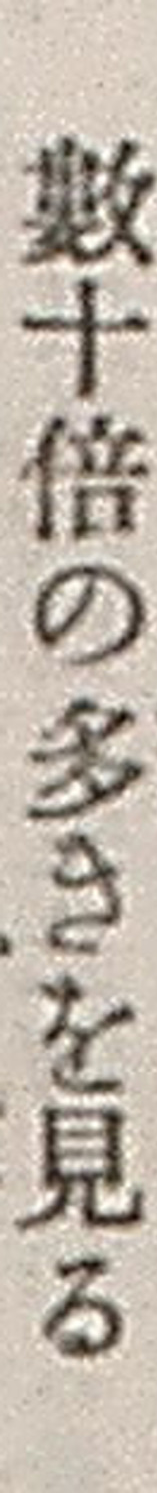数十倍の多きを見る
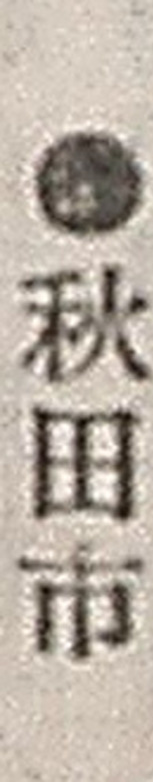●秋田市
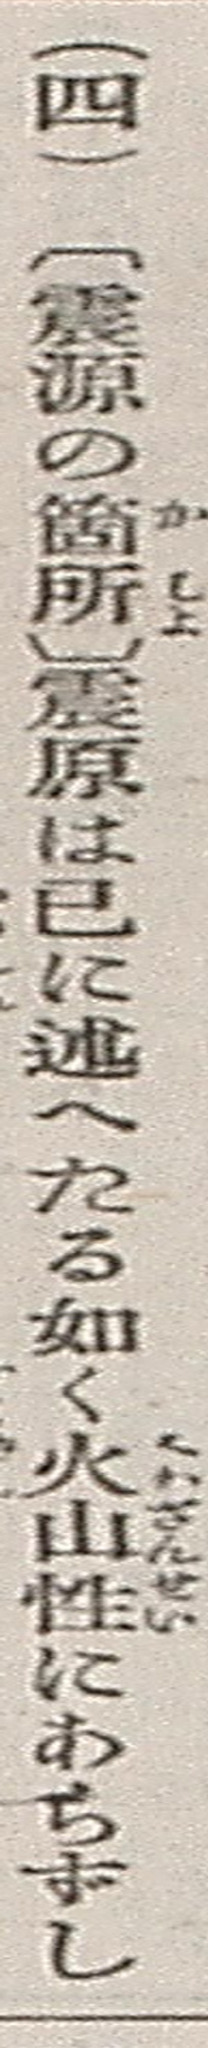[震源の箇所]震源は已に述へたる如く火山性にあらずし
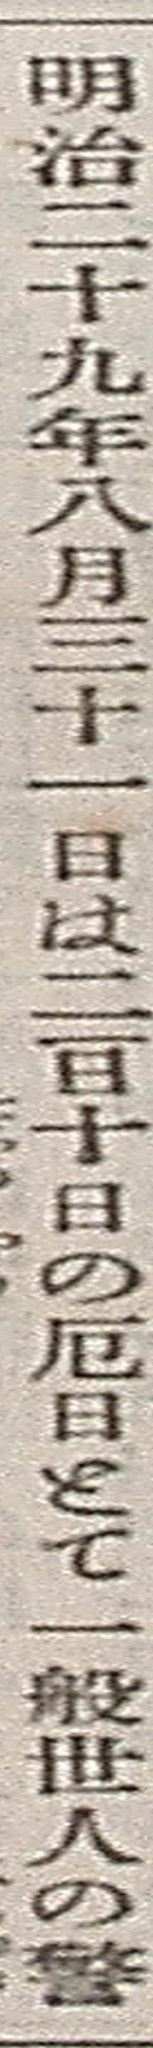明治二十九年八月三十一日は二百十日の厄日とて一般世人の警
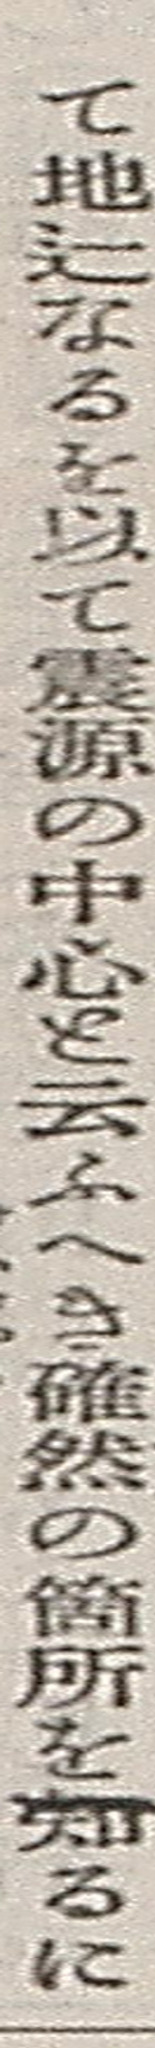て地辷なるを以て震源の中心と云ふへき確然の箇所を知るに
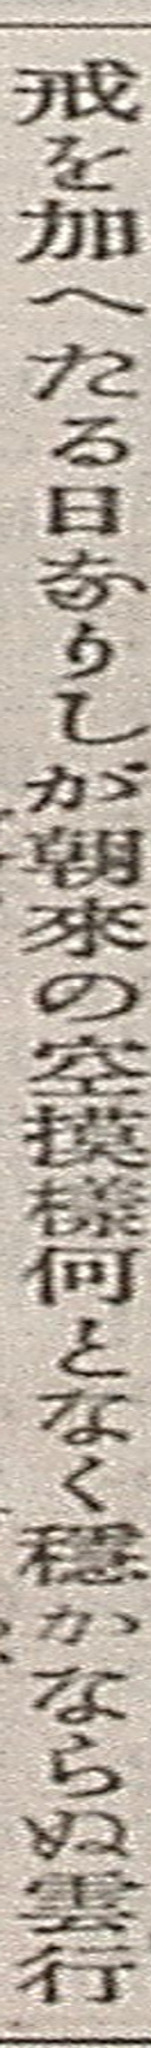戒を加へたる日なりしが朝来の空模様何となく穏かならぬ雲行
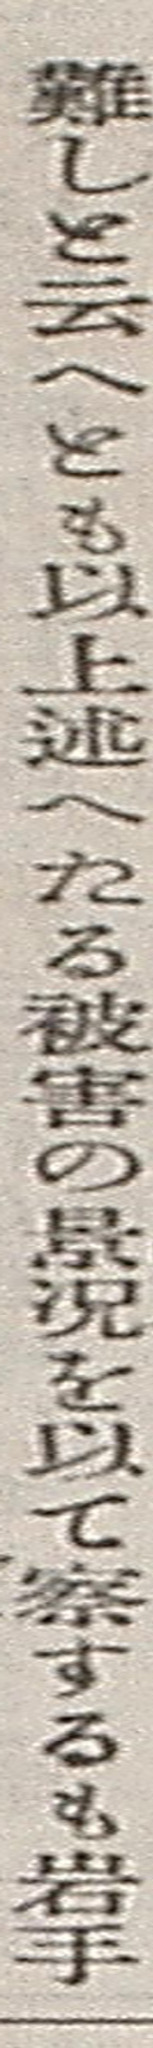難しと云へとも以上述へたる被害の景況を以て察するも岩手
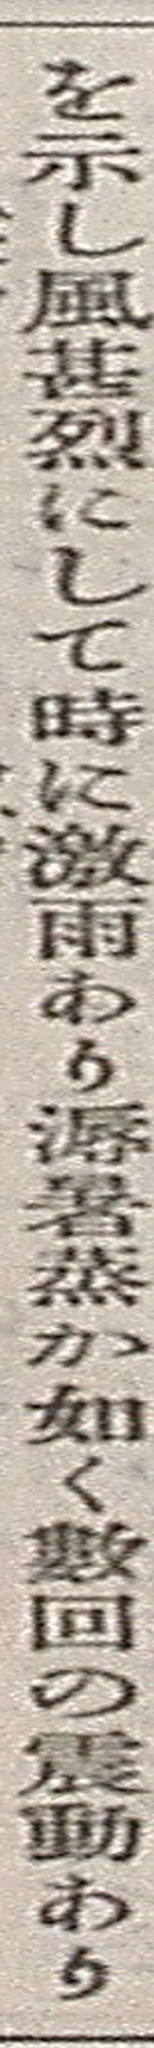を示し風甚烈にして時に激雨あり溽暑蒸か如く数回の震動あり
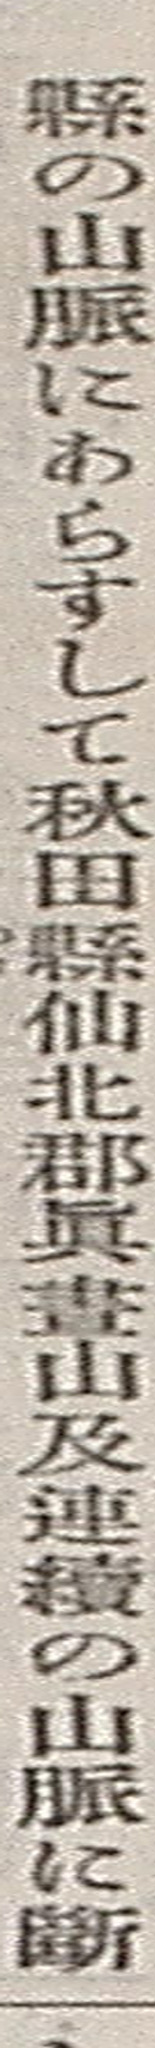県の山脈にあらずして秋田県仙北郡真昼山及連続の山脈に断
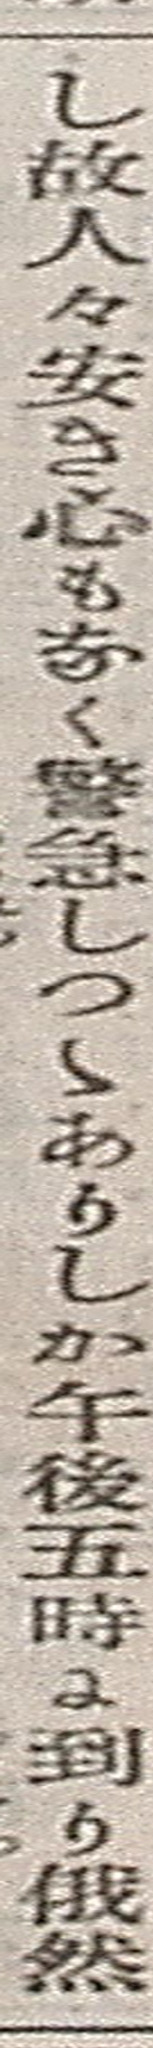し故人々安き心もなく警急しつゝありしか午後五時に到り俄然
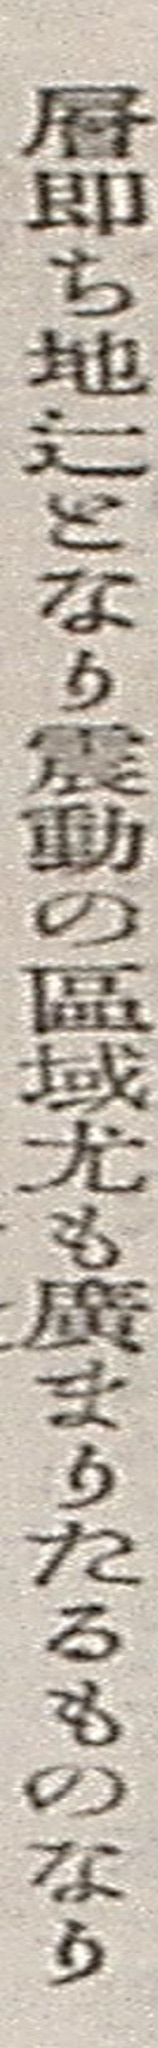層即ち地辷となり震動の区域尤も広まりたるものなり
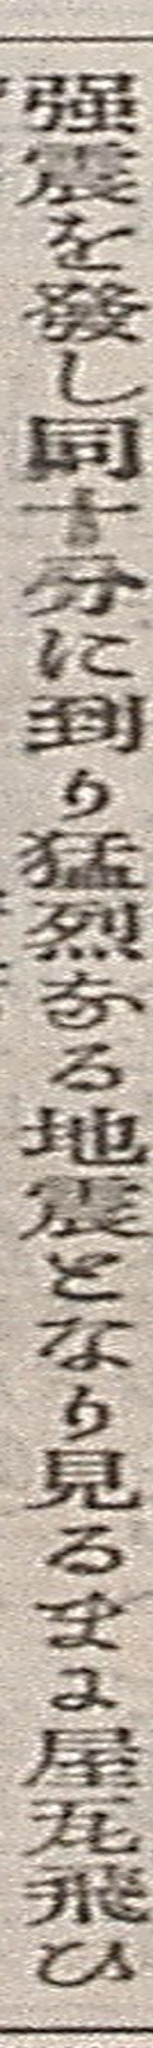強震を発し同十分に到り猛烈なる地震となり見るまに屋瓦飛ひ
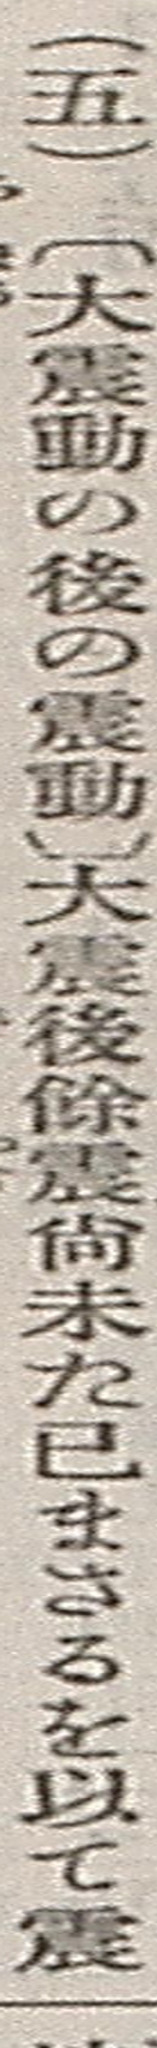[大地震の後の震動]大震後余震尚未た已まさるを以て震
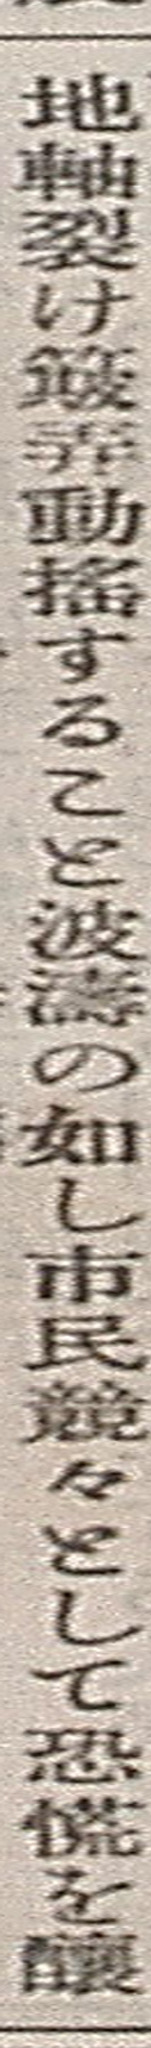地軸裂け簸弄動揺すること波濤の如し市民競々として恐怖を醸
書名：風俗畫報臨時増刊第百二十四號　洪水地震被害録（上）
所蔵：東京大学地震研究所図書室 Earthquake Research Institute Library, The University of Tokyo, JAPAN
